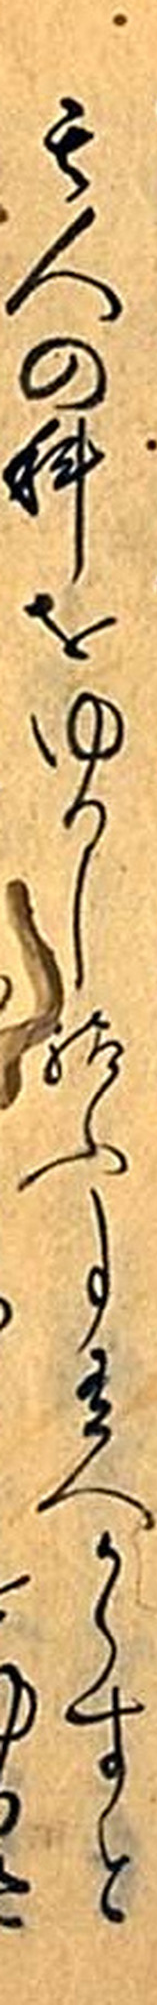其人の科をゆるし給ふ事有へからすと
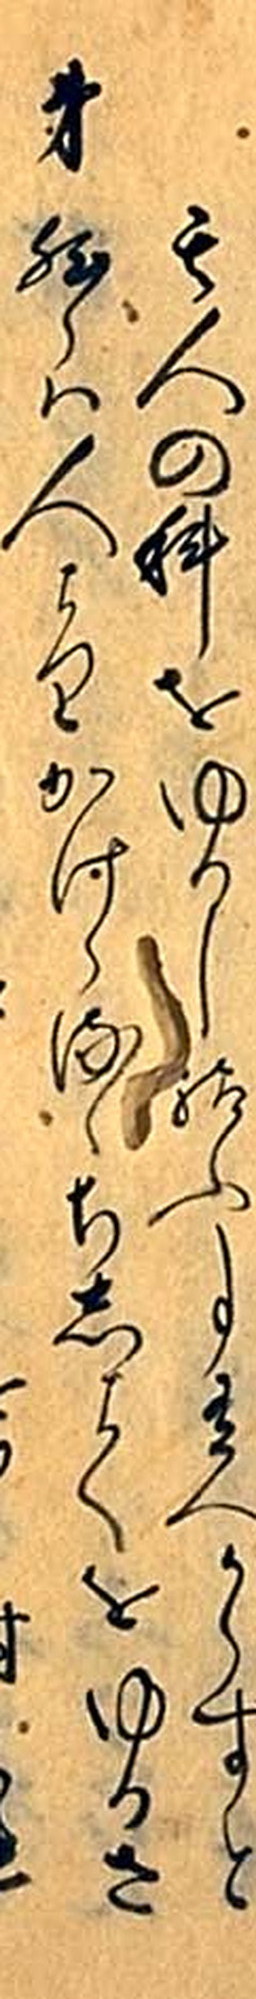弟然らは人よりかけらるゝちしよくをゆるさ
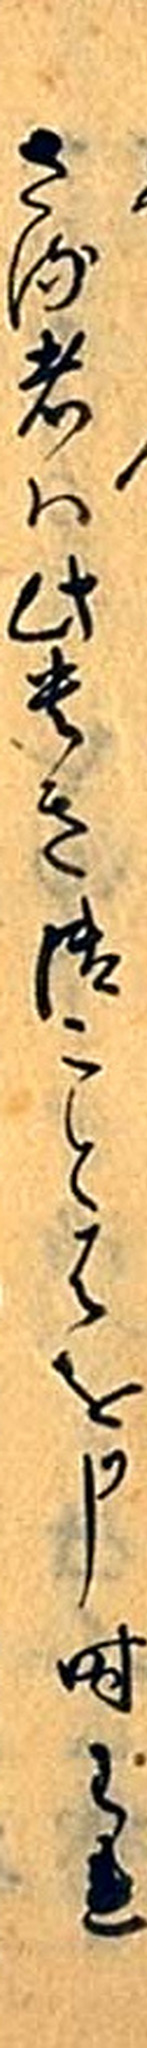さる者は此貴き御ことはを申時われ
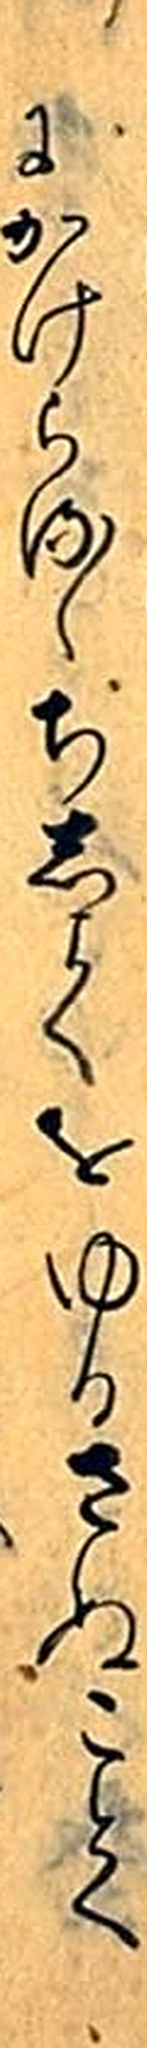にかけらるゝちしよくをゆるさぬことく
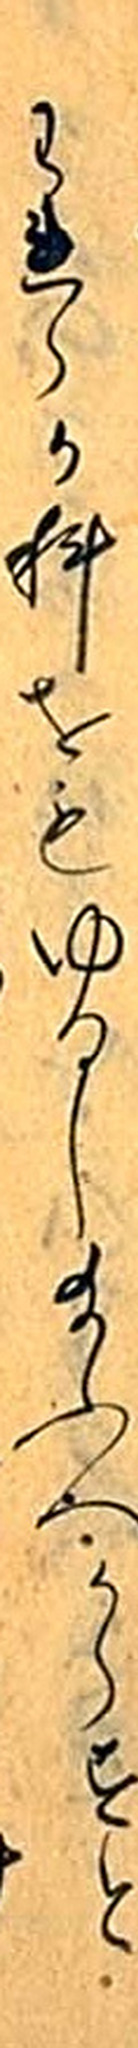われらか科をもゆるし給ふへからすと
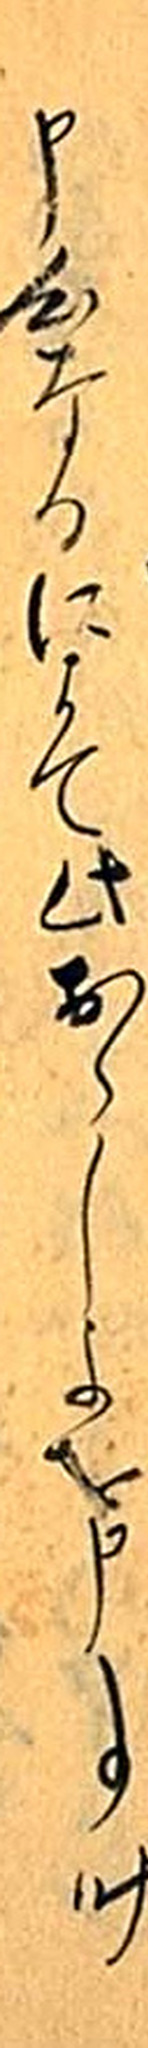申心なるによて此おらしよを申事叶
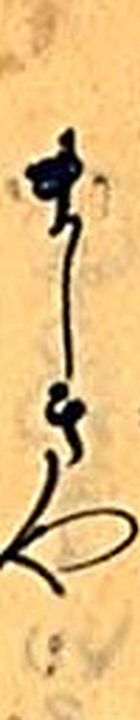ましきや
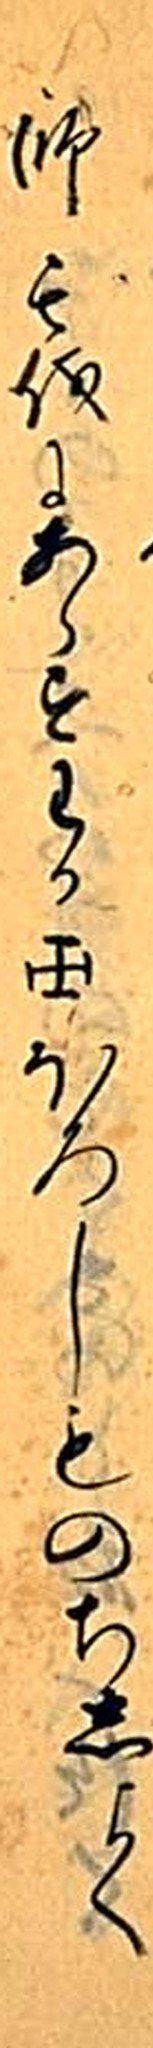師其儀にあらすわか☩ほろしものちしよく
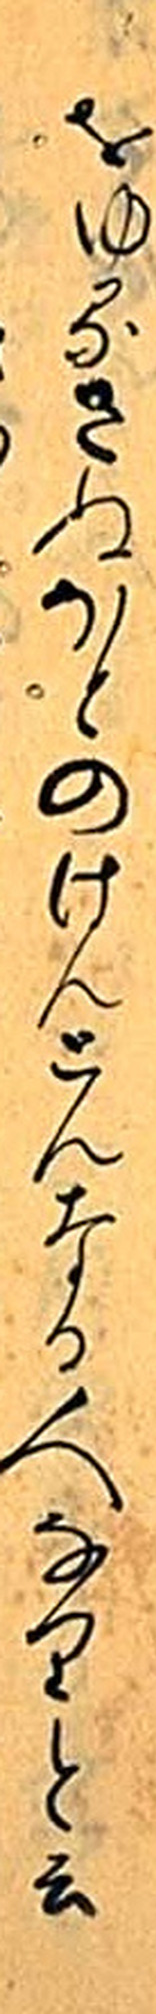をゆるさぬほとのけんとんなる人なりと云
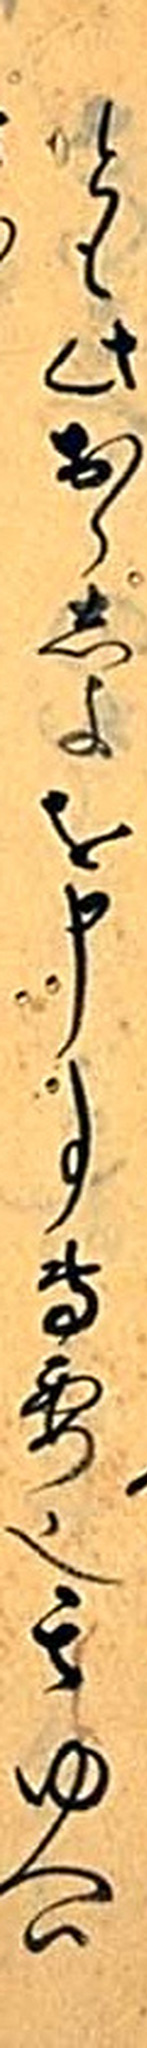とも此おらしよを申事専要也其ゆへは
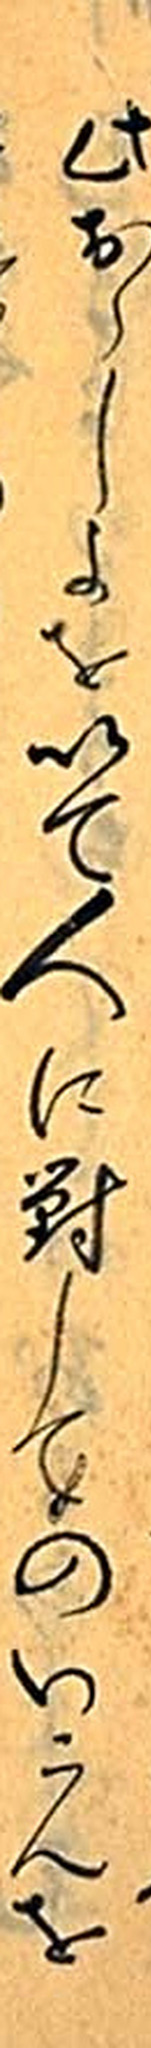此おらしよを以て人に対してのいこんを
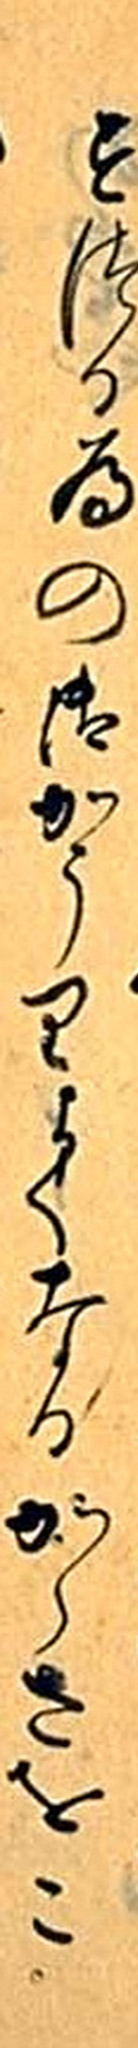すつる為の御かうりよくなるからさをこ
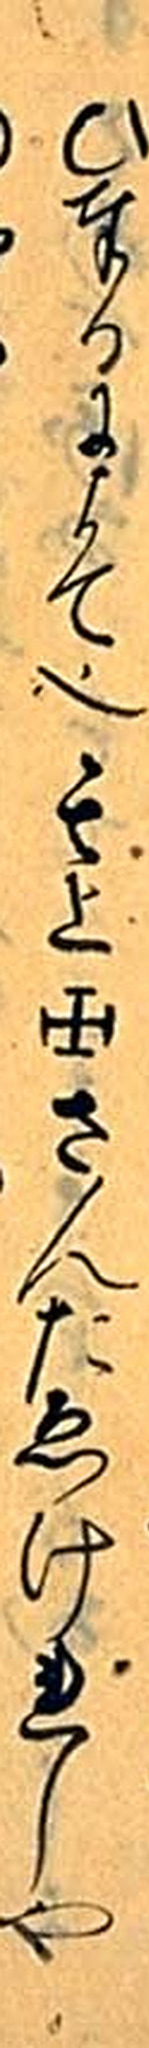ひ奉るによて也其上☩さんたゑけれしや
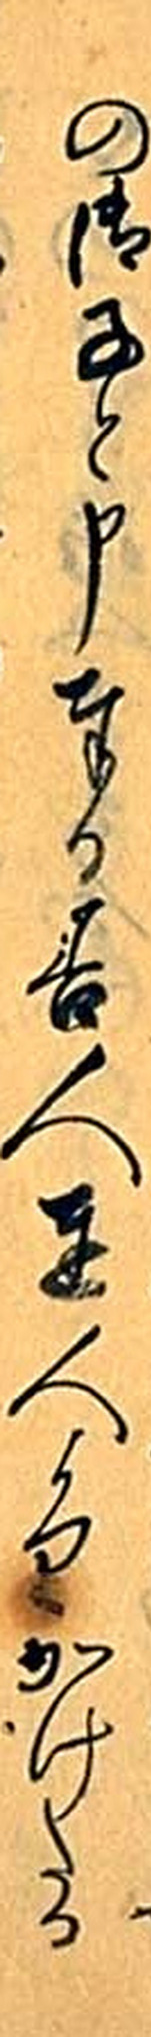の御子と申奉る善人達人よりかけたる
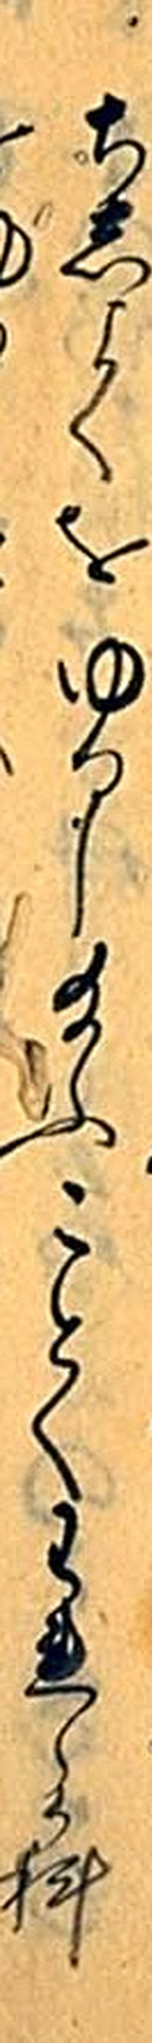ちしよくをゆるし給ふことくわれらか科
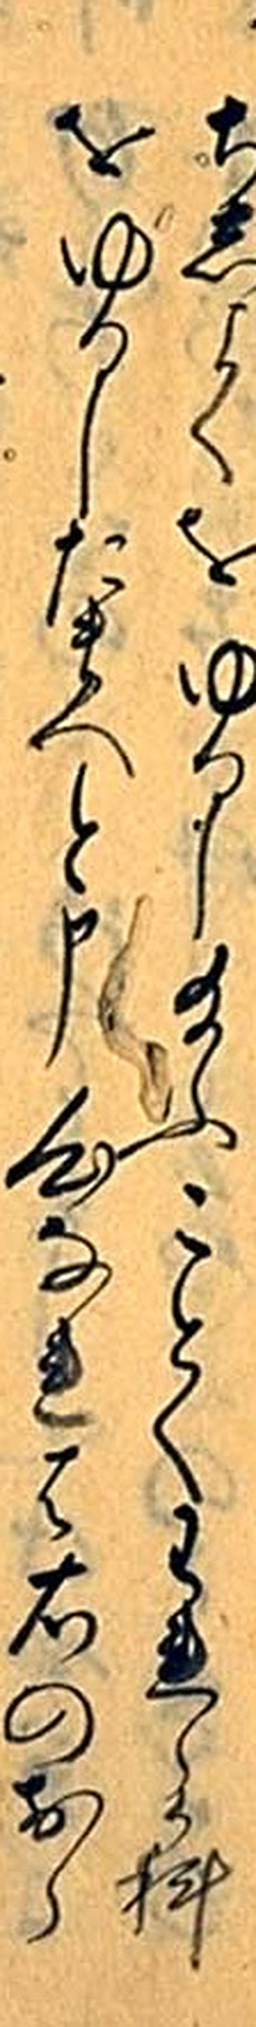をゆるしたまへと申心なれは右のおら
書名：ドチリナ・キリシタン
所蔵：東京大学総合図書館 / General Library in the University of Tokyo
